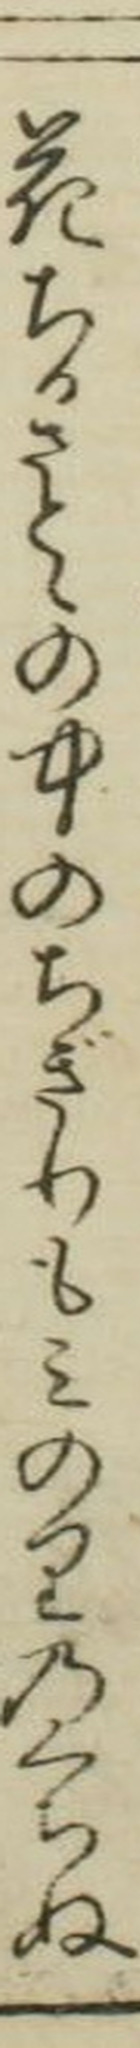花ちるさとゝの中のちぎりもみのりのくちぬ
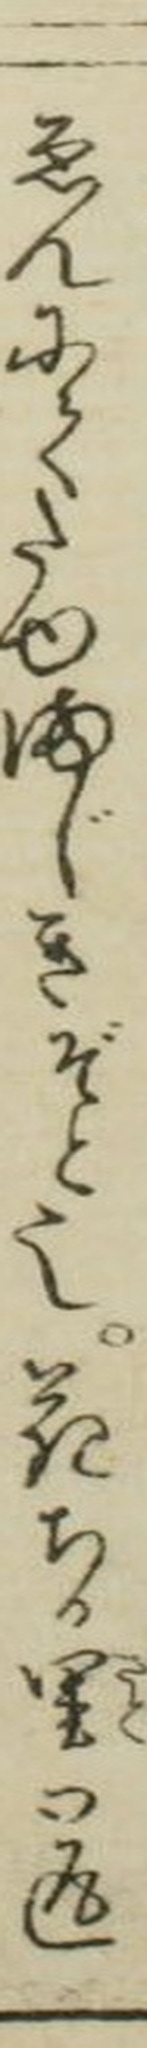ゑんにてたゆまじきぞと也。花ちる里御返
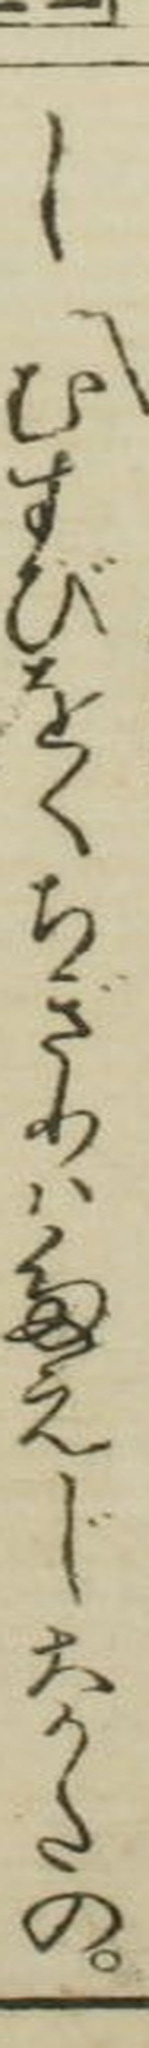し〽むすびをくちぎりはたえじ大かたの。
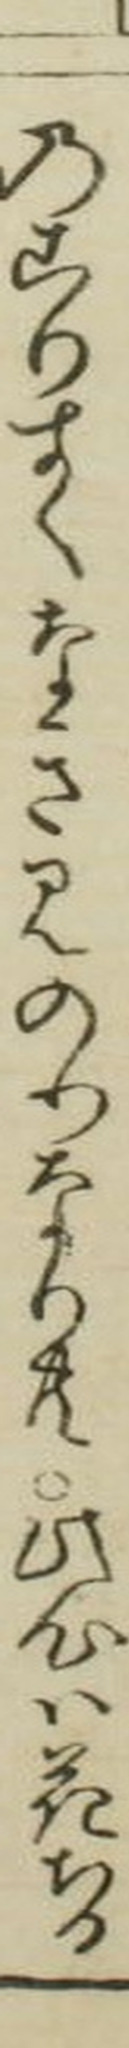のこりすくなきみのりなり共。◯此心は花ちる
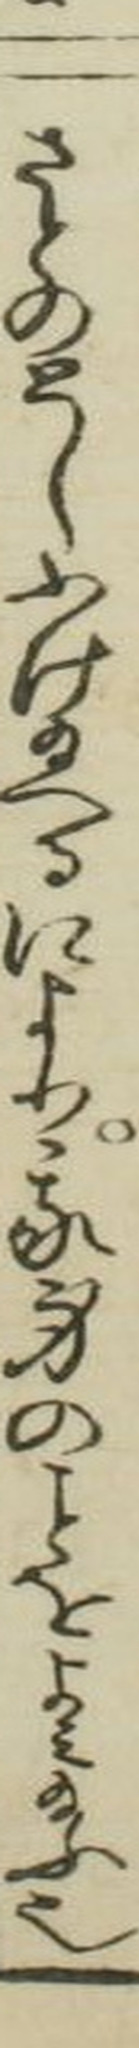さとのとしふけ給へるにより。我身のことをよみ給ふ也
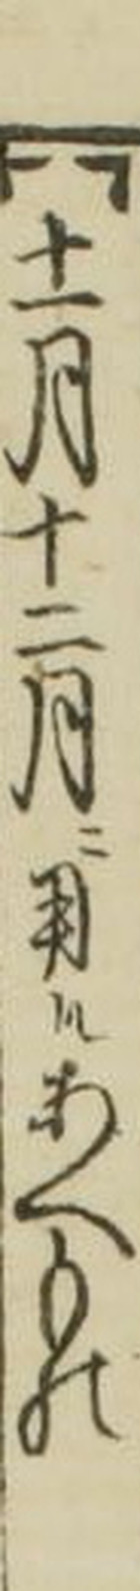十一月十二月用あへもの
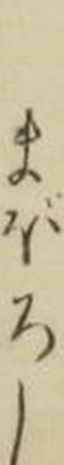まぼろ
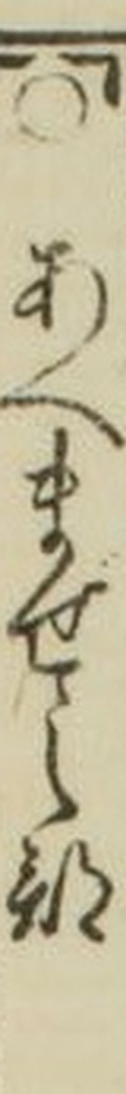◯あへまぜ之部
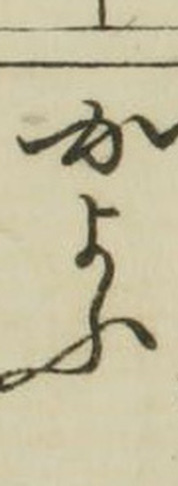かよふ
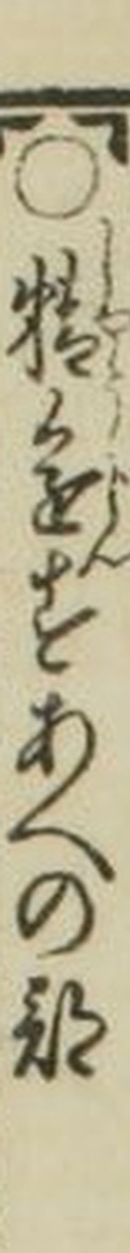◯精進すあへの部
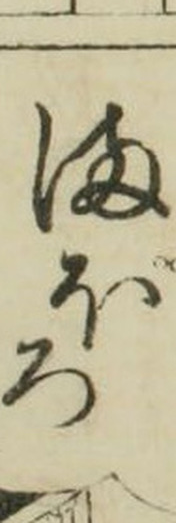まぼろ
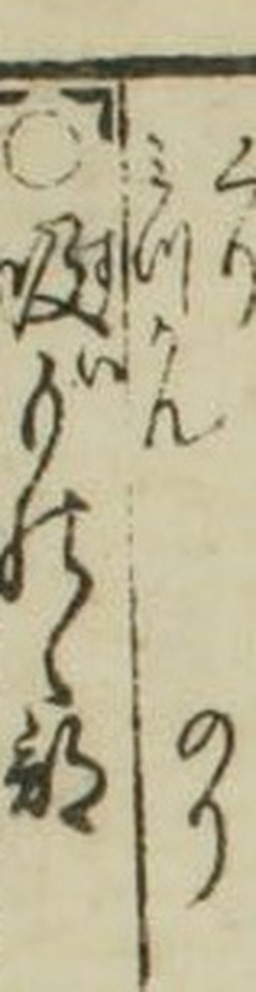◯吸ものゝ部
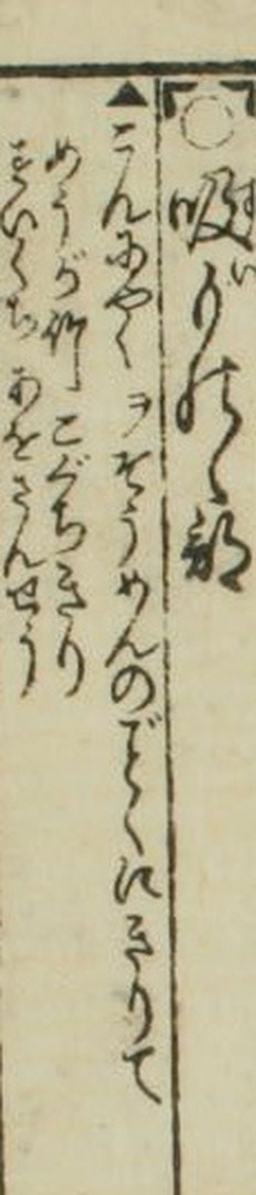▲こんにやくそうめんのごとくにきりて
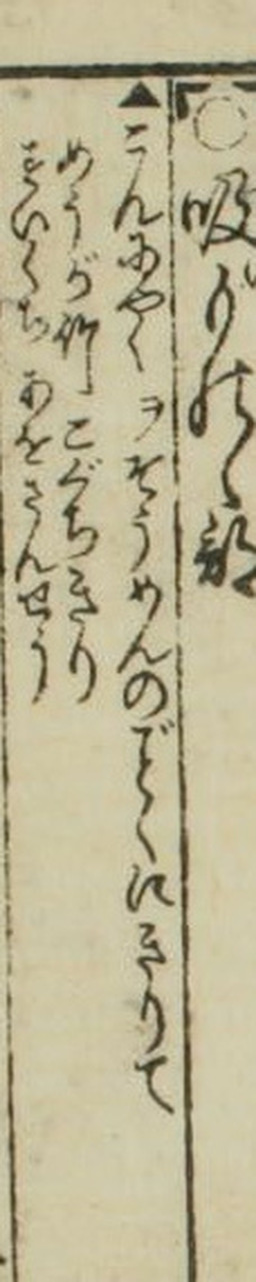▲こんにやくそうめんのごとくにきりて
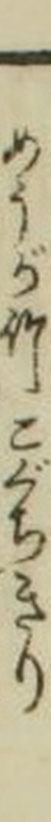めうが竹こぐちきり
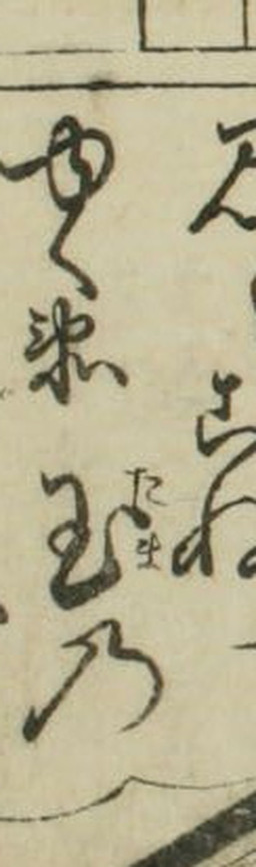ゆくゑ玉の
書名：女源氏教訓鑑
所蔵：東京学芸大学附属図書館
